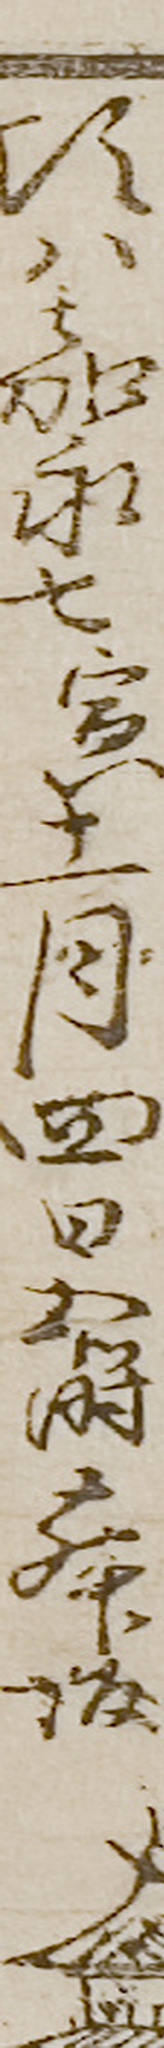頃は嘉永七寅十一月四日五ツ時舞坂
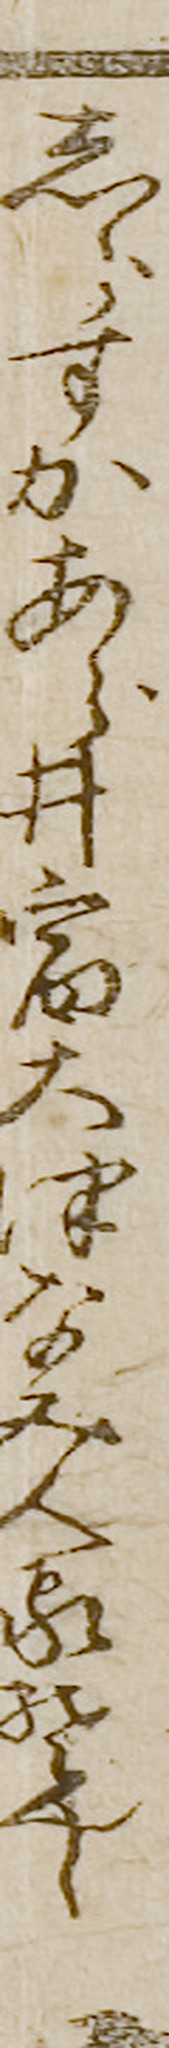しらすかあら井宿大つなみ人家そんし
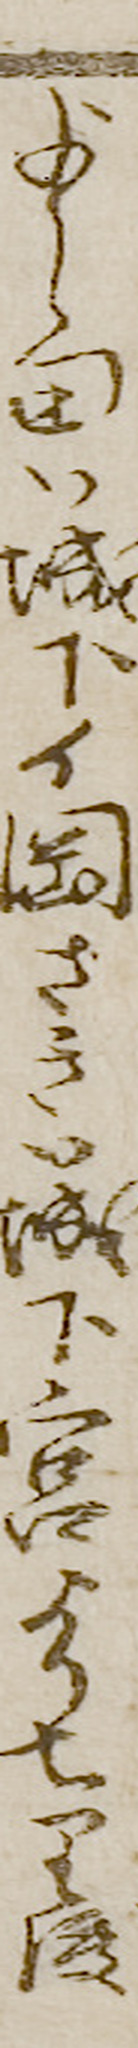よし田御城下ゟ岡さき御城下宮より七里渡
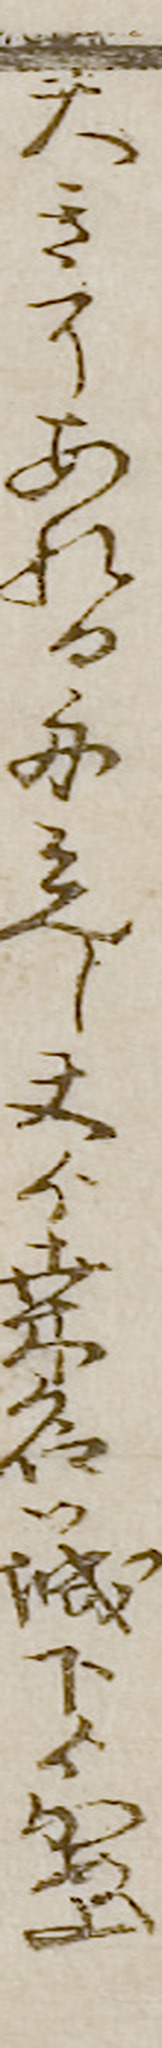大きにあれる舟そんし夫ゟ桑名御城下ゟかめ山
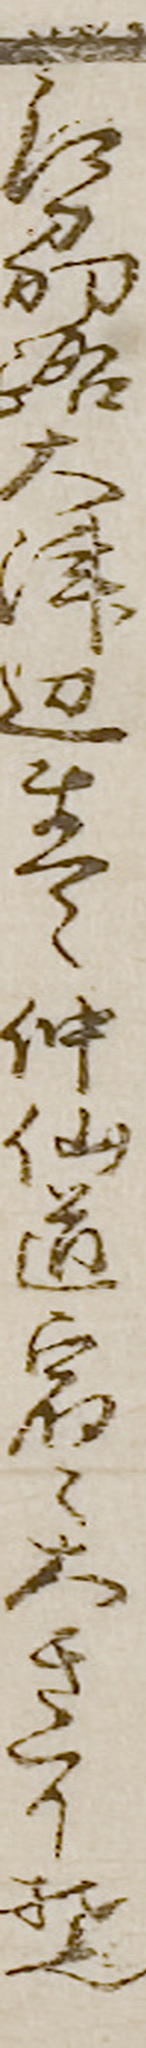江州路大津辺まて仲仙道宿々大きにそん
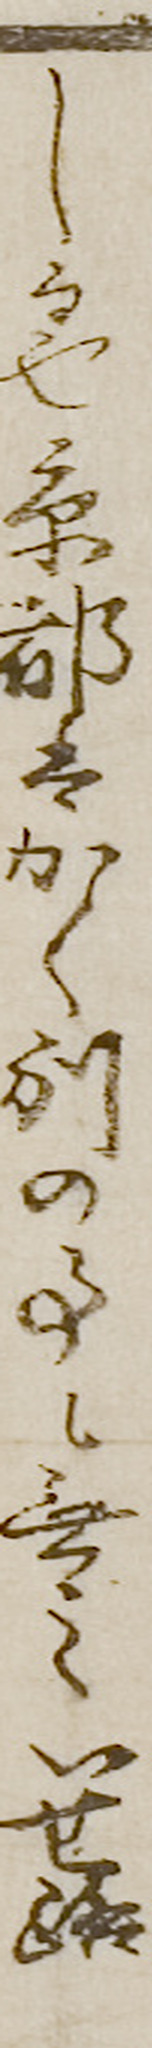しる也京都はかく別の事も無之いせ路
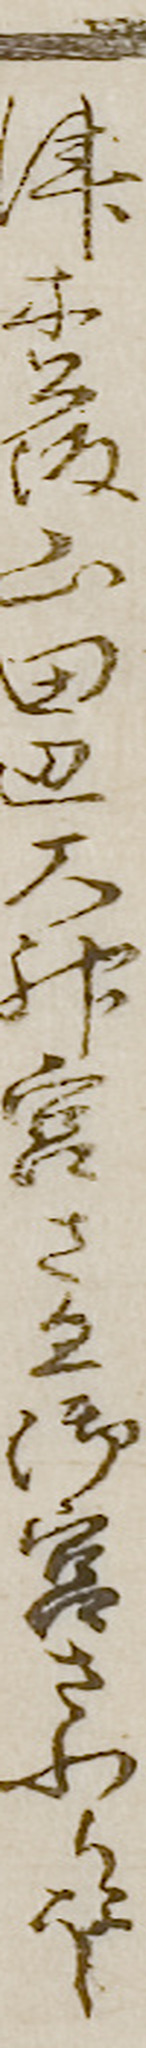津松坂山田辺大神宮さま御宮さわりなし
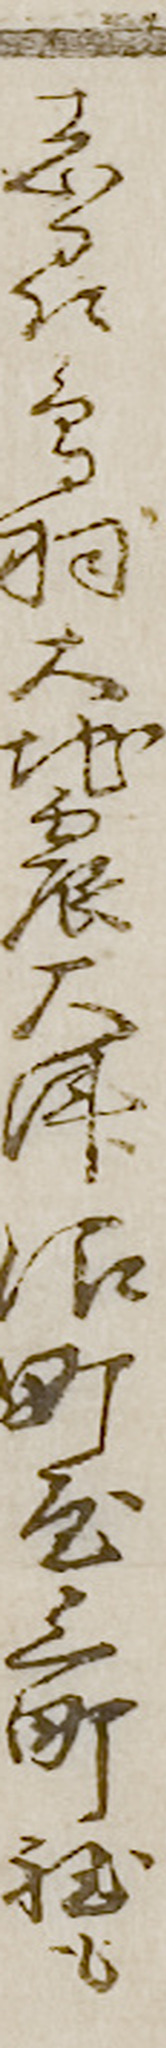志州鳥羽大地震大津浪町屋三町程も
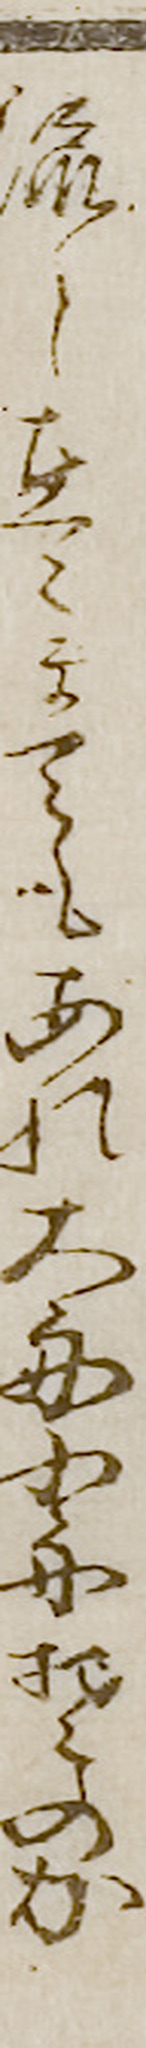流し在々まてもあれ大舟小舟そのか
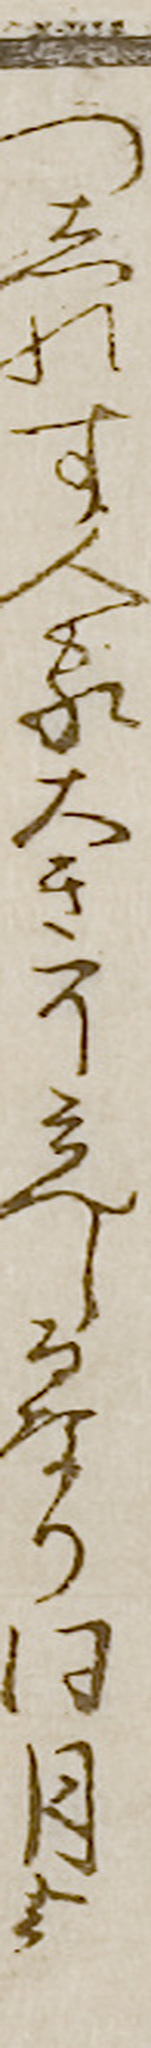つしれす人家大きにそんしるなり同月五
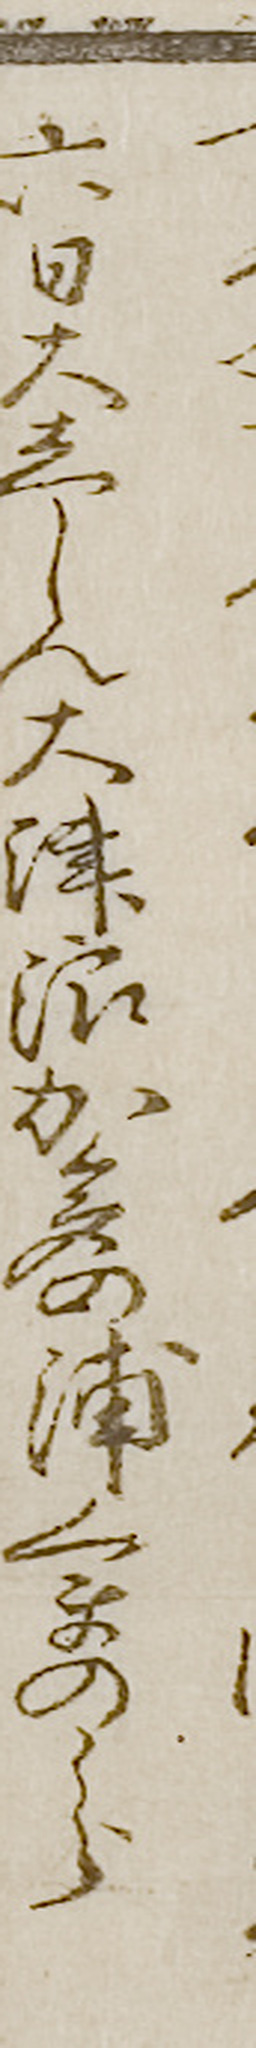六日大ししん大津浪加たの浦くまのうら
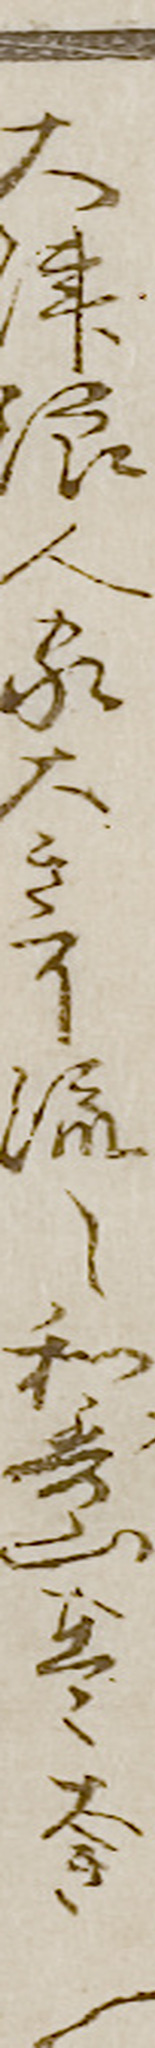大津浪人家大きに流し和歌山在々大き
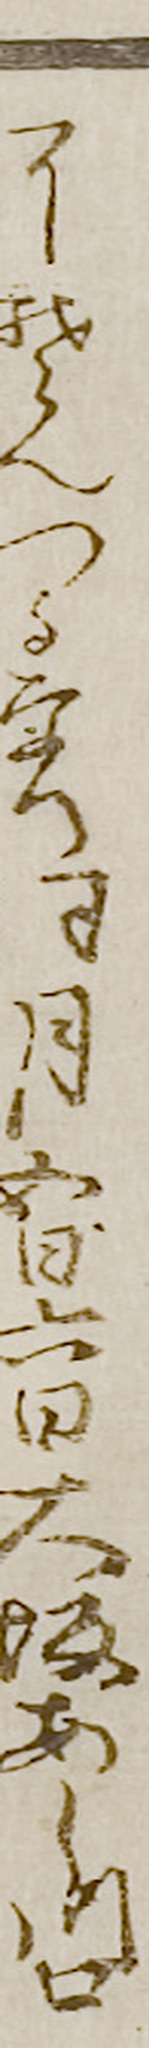にそんつるなり同月五日六日大坂あし川口
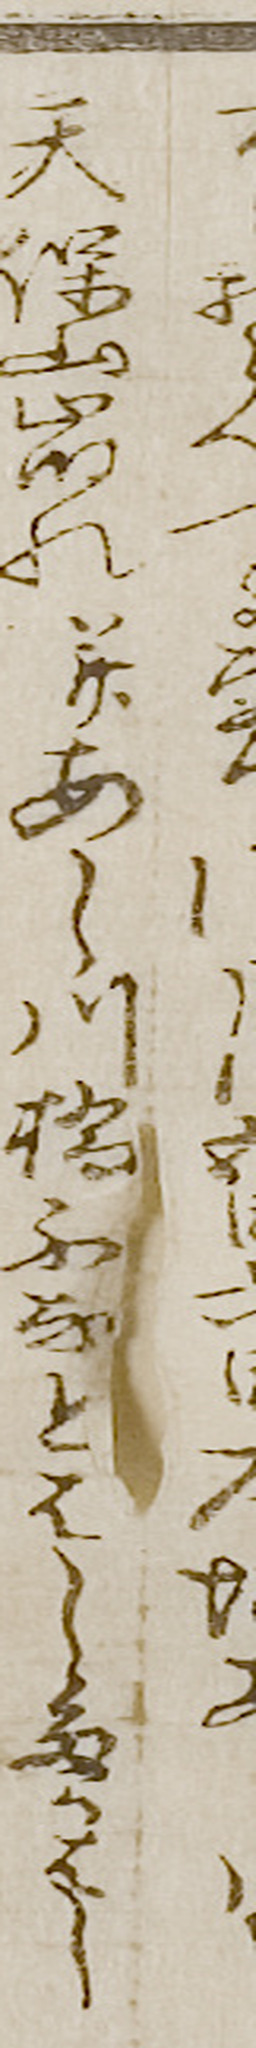天保山崩れ并あし川橋ふなとはしたかはし
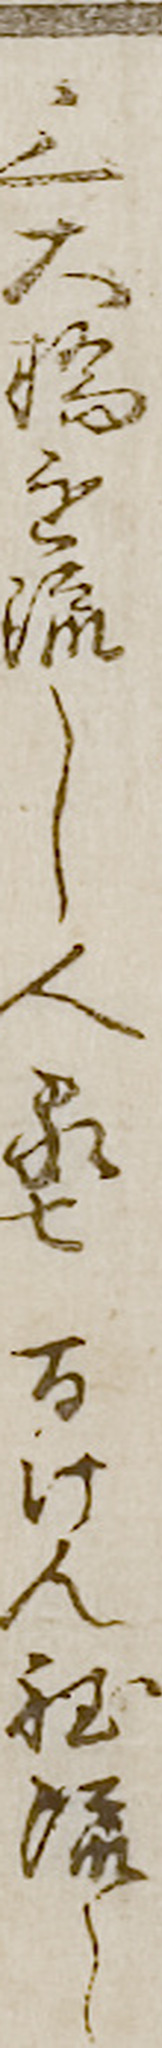三大橋を流し人家七百けん程流し
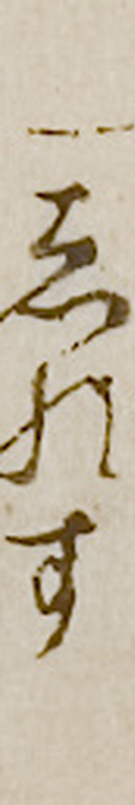しれす
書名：[嘉永七寅十一月四日大津波]
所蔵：東京大学総合図書館 General Library in the University of Tokyo, JAPAN
